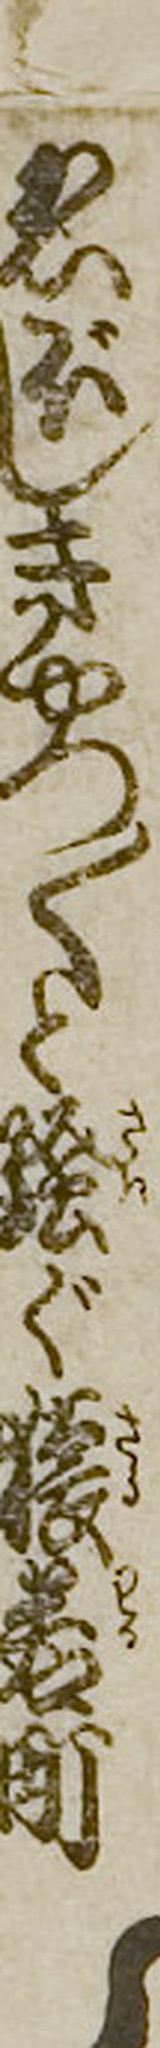ゑぼしきやつ〳〵と騒ぐ猿若町
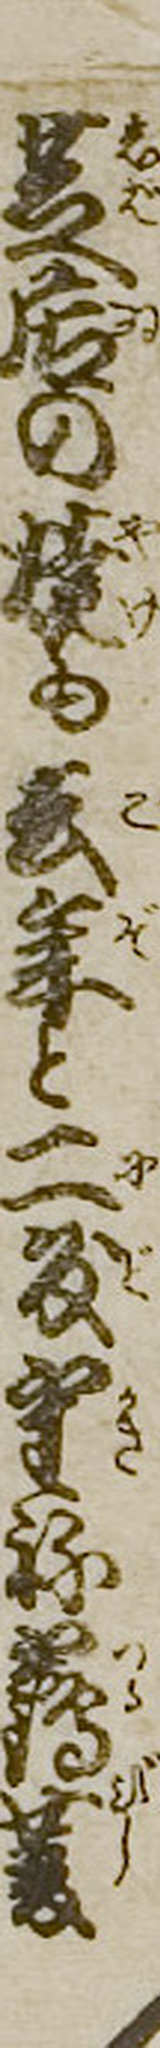芝居の焼も去年と二度重ね鶴菱
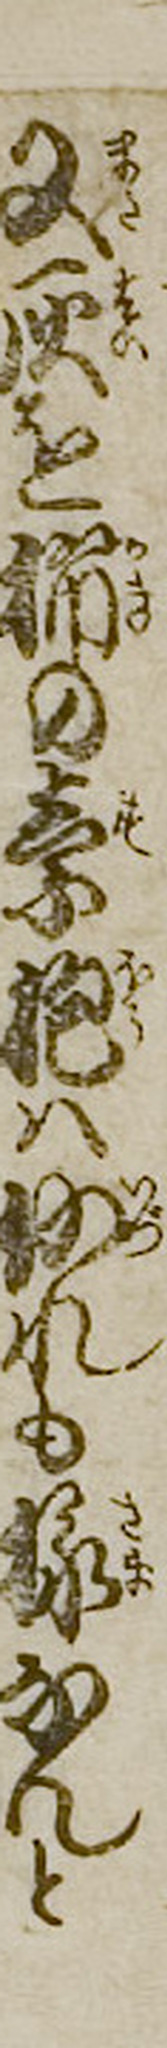又灰を柿の素袍は何れも様なんと
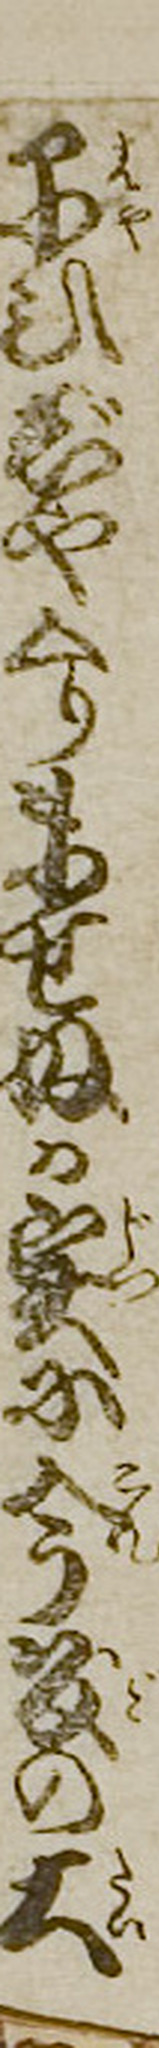早ひじや厶りませぬか実に今度の大
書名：しばらくのそとね
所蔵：東京大学総合図書館 General Library in the University of Tokyo, JAPAN
